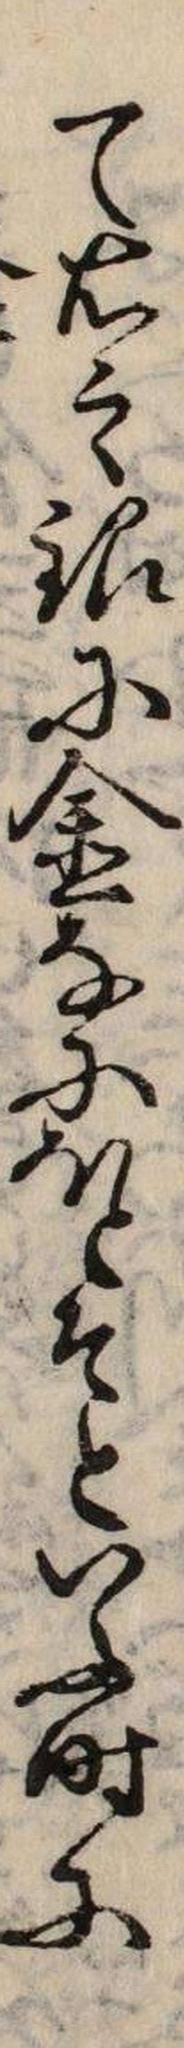て右の銀に金なにほとそといふ時に
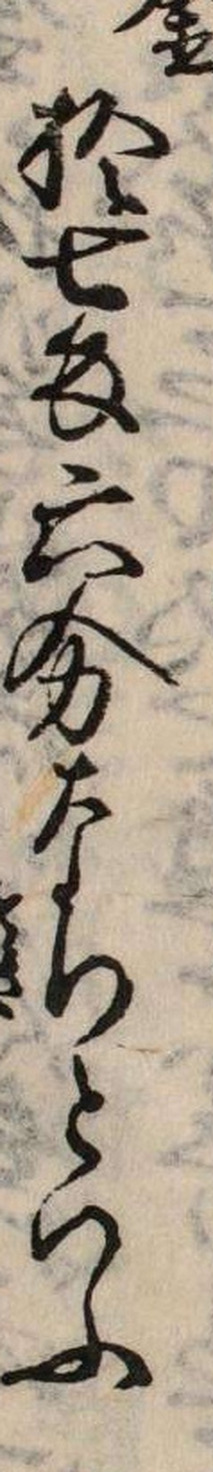金拾七匁六分なりといふ
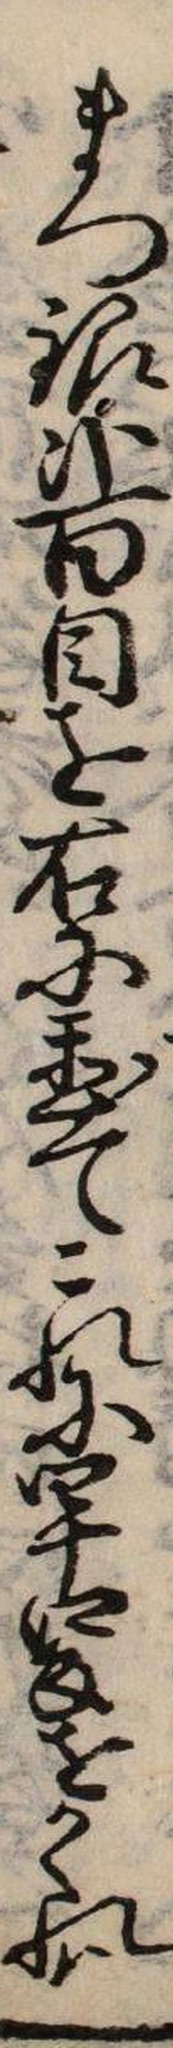まつ銀弐百目を右に置てこれに四十四匁をかくれは
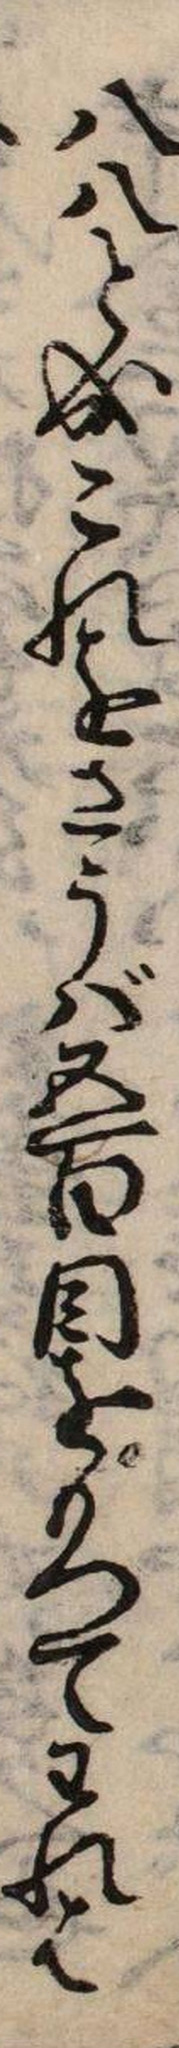八八と成これをさうば五百目をもつてわれは
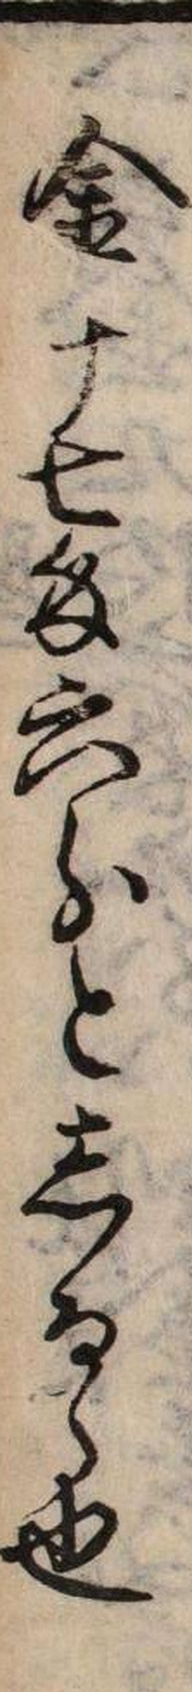金十七匁六分としるゝ也

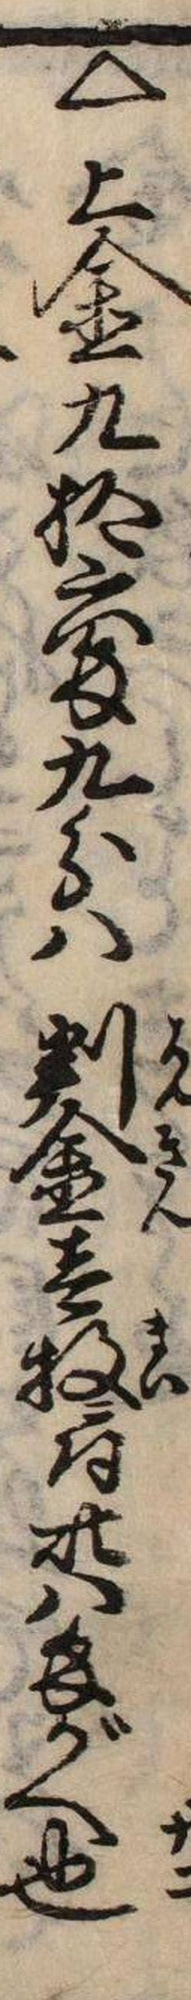△上金九拾六匁九分は判金壱枚に付卅八匁がへ也
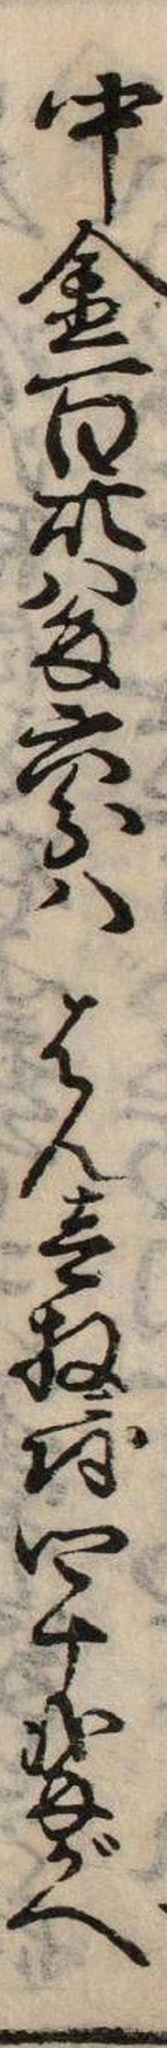中金百丗八匁六分ははん壱枚に付四十弐匁がへ
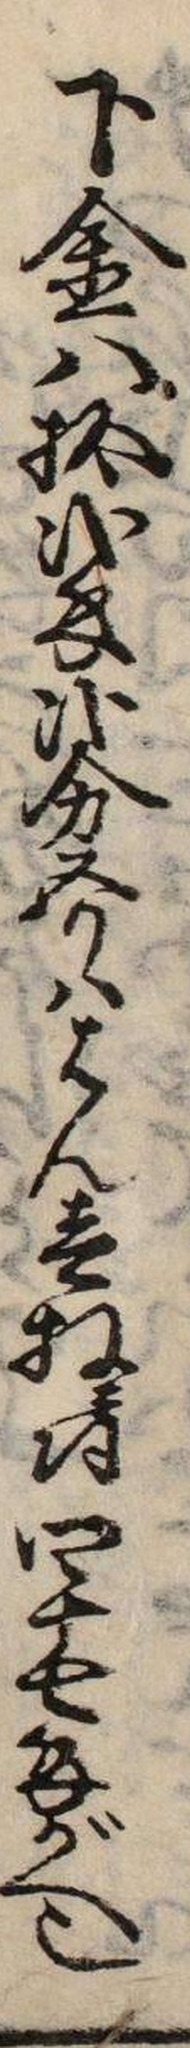下金八拾弐匁弐分五りははん壱枚に付四十七匁がへ也
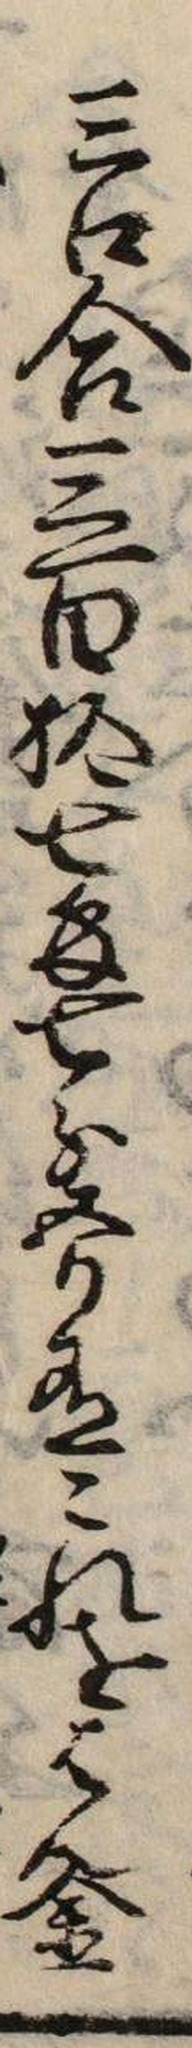三口合三百拾七匁七分五り有これをはん金
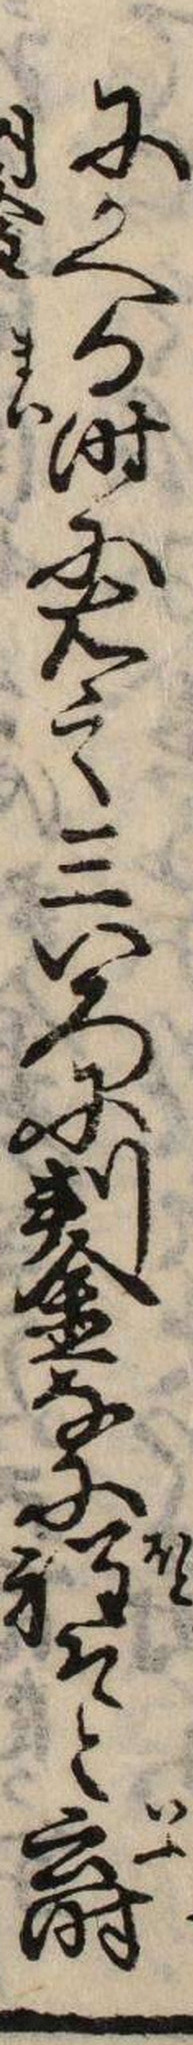にかへる時に右の三いろに判金なに程そと云時
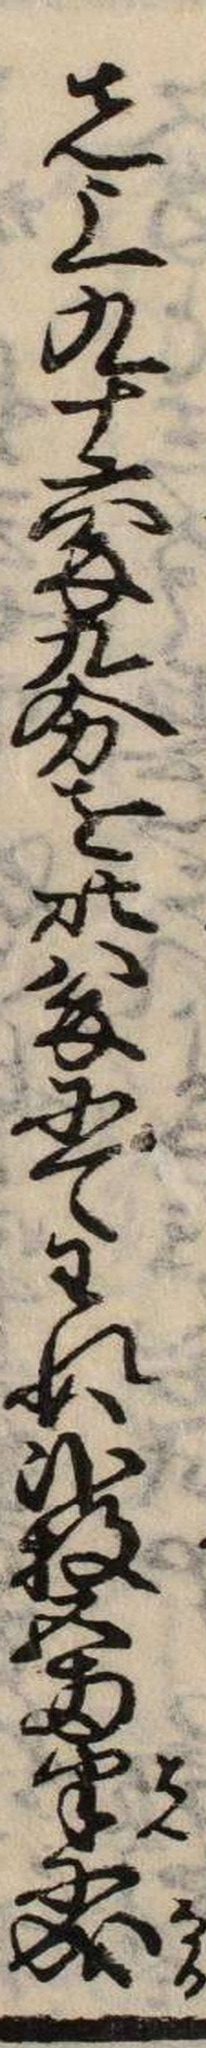先上九十六匁九分を卅八匁にてわれは弐枚五両半に成
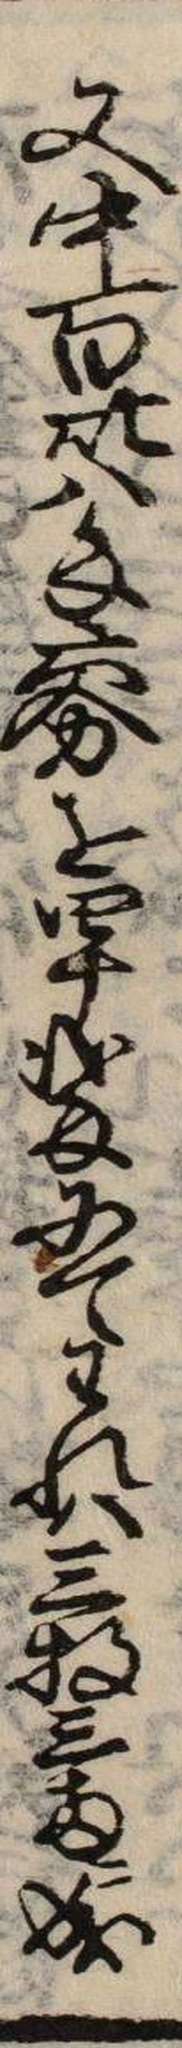又中百卅八匁六分を四十弐匁にてわれは三枚三両に成
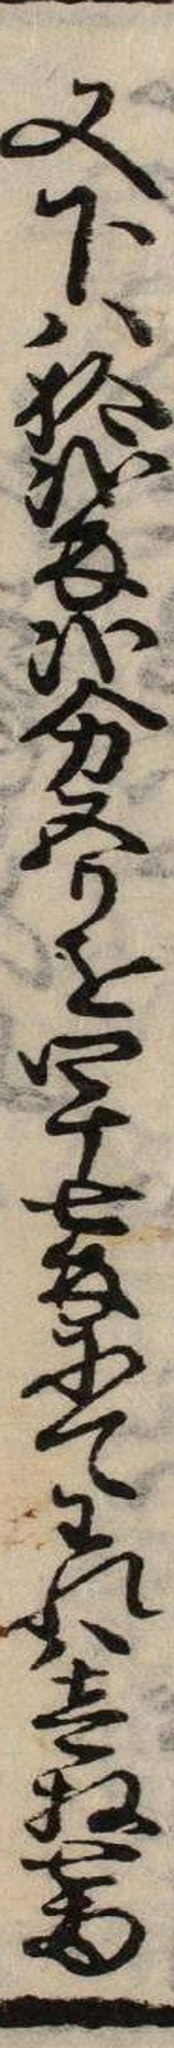又下は拾弐匁弐分五りを四十七匁にてわれは壱枚七両
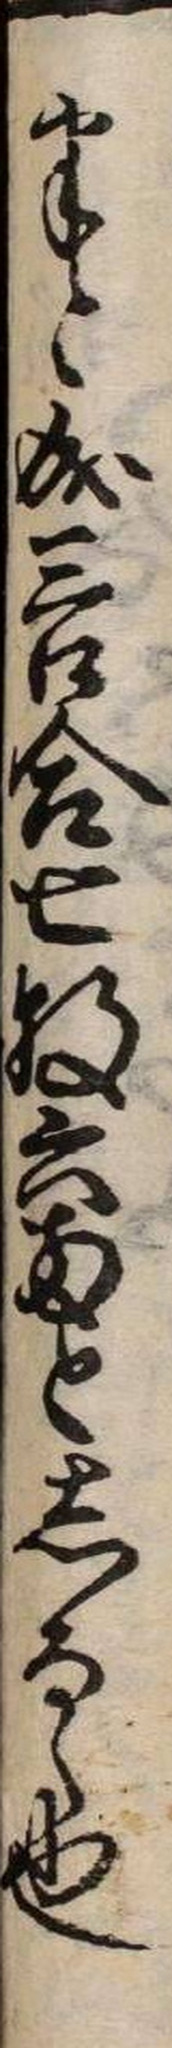半と成三口合七枚六両としるゝ也
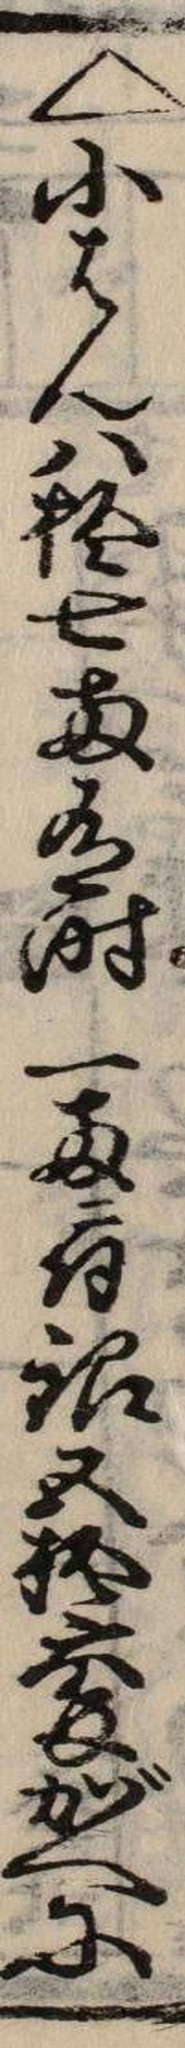△小はん八拾七両有時一両に付銀五拾六匁がへに
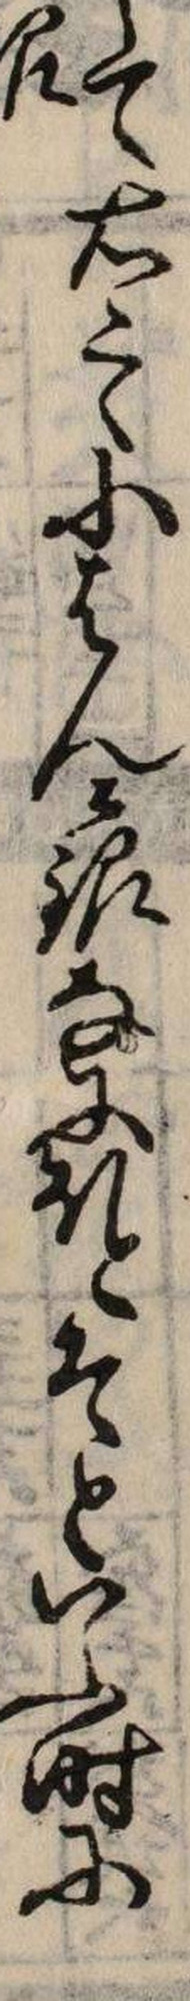して右の小はんに銀なにほとそといふ時に
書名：塵劫記（寛永11年自跋、京都府立京都学・歴彩館追貴8）
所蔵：京都府立京都学・歴彩館 国文学研究資料館
